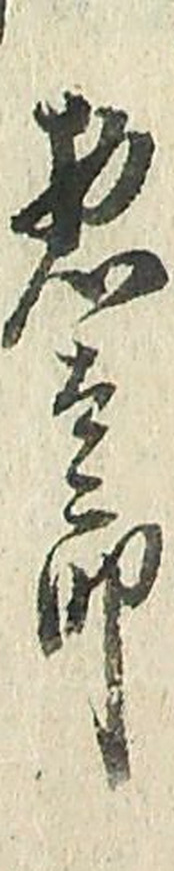惣太郎
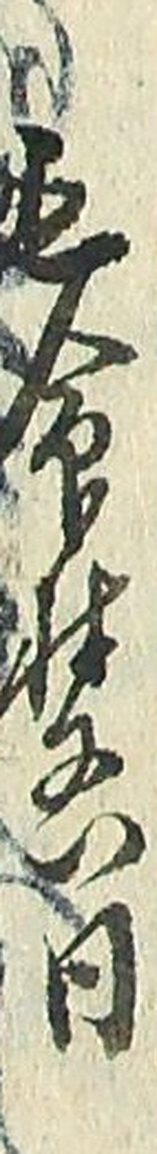延命村右同
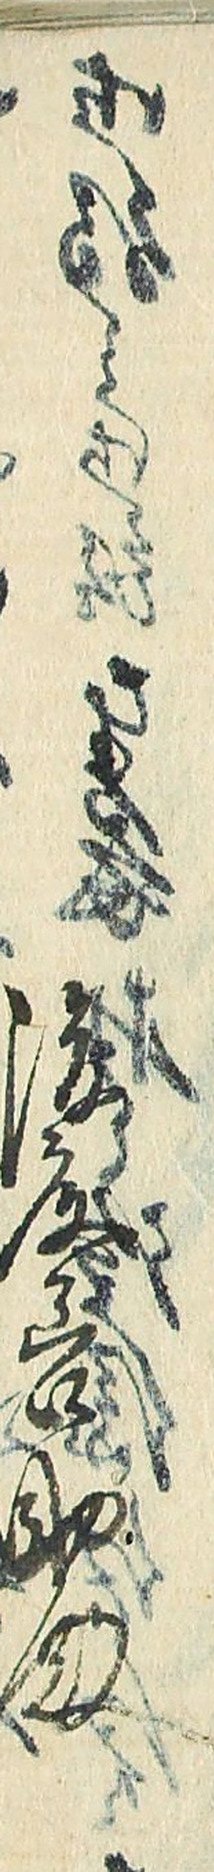後藤善助殿
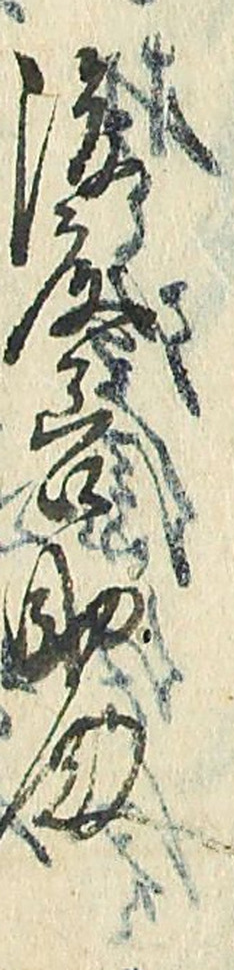後藤善助殿

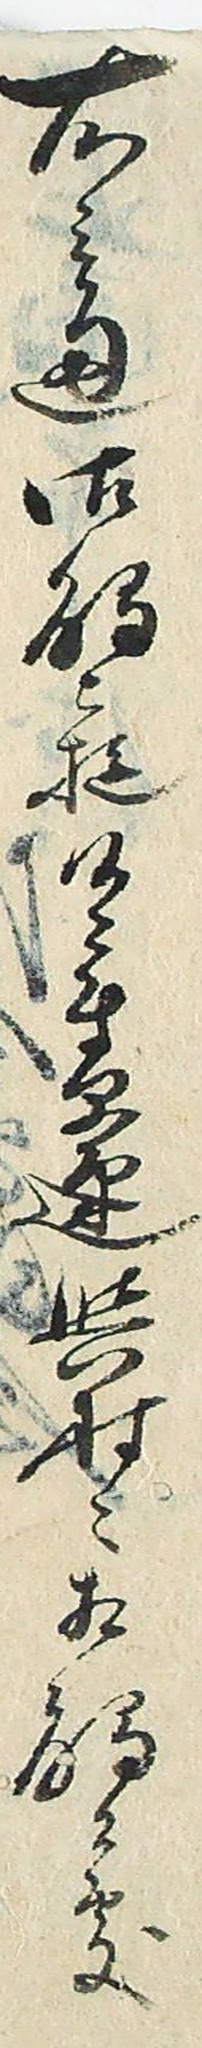右之通御触被遊候に付早速与村々相触候処
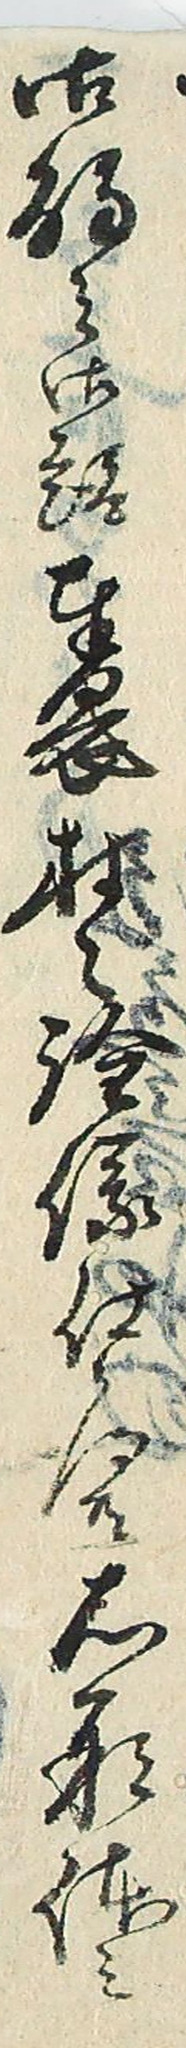御触之御趣奉畏村々詮儀仕候得共右形体之
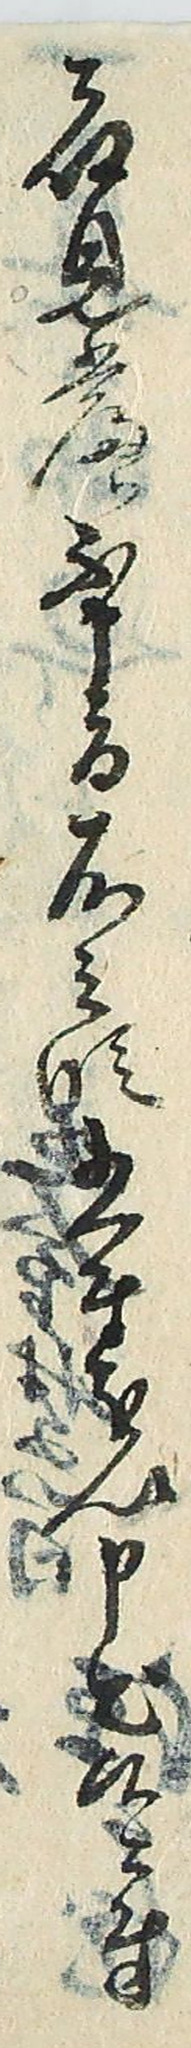者見当り不申旨右之段書付を以申出候に付
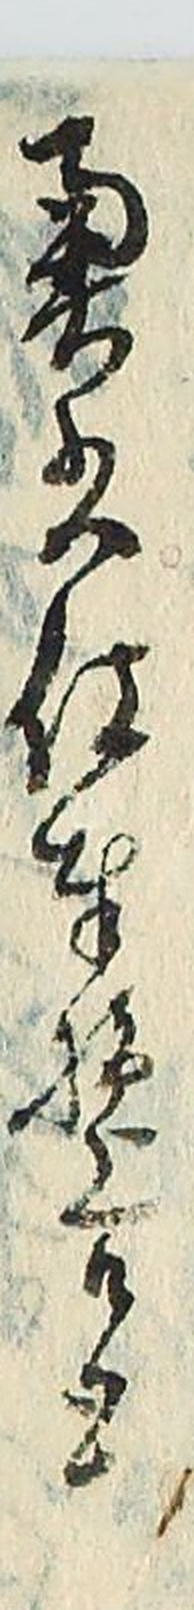奥書仕奉指上候以上
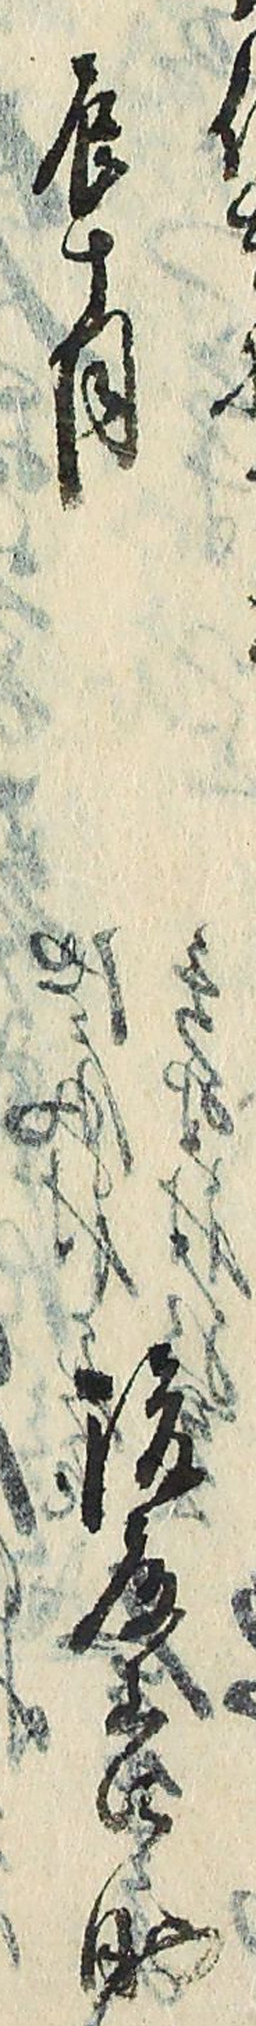辰十月後藤善助
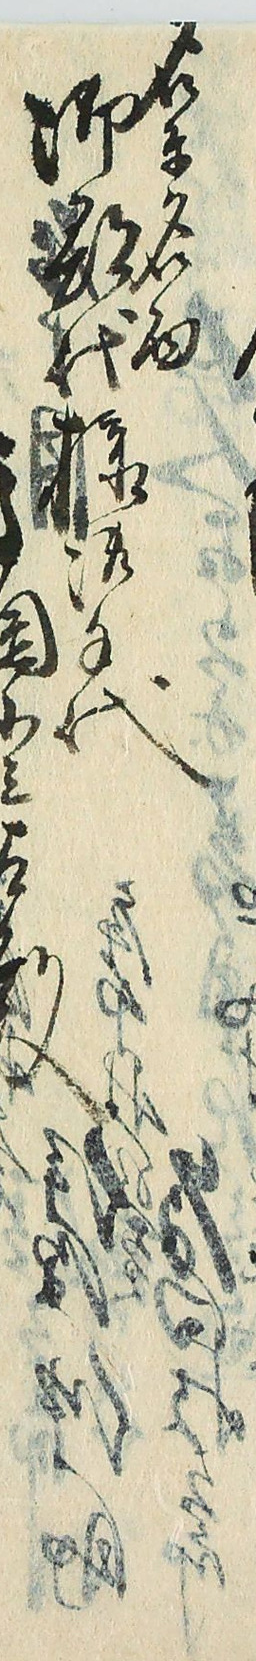御郡代様御手代
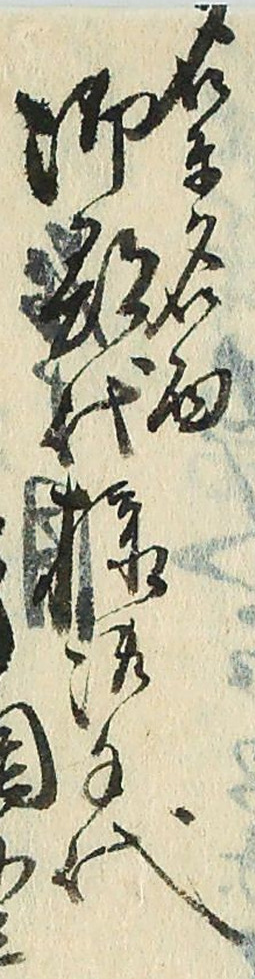御郡代様御手代
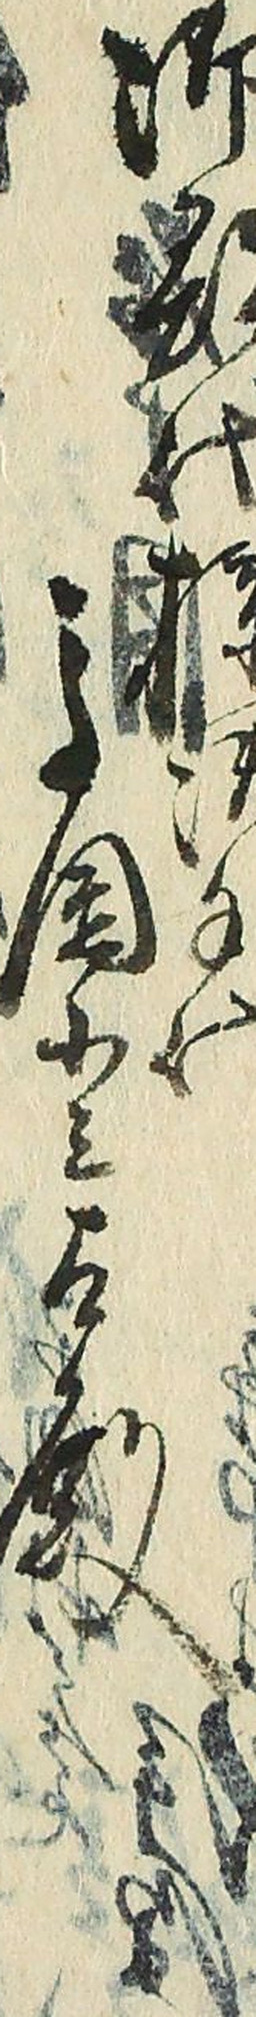高岡小三太殿
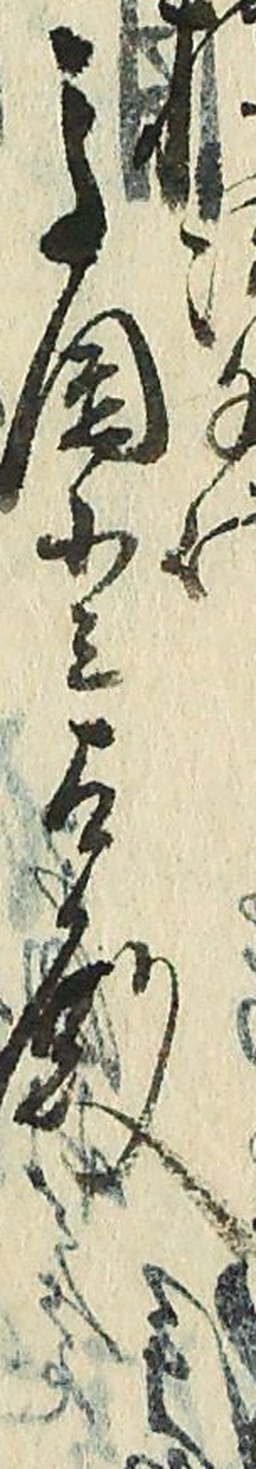高岡小三太殿

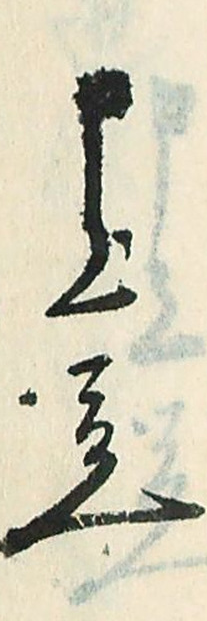申上覚
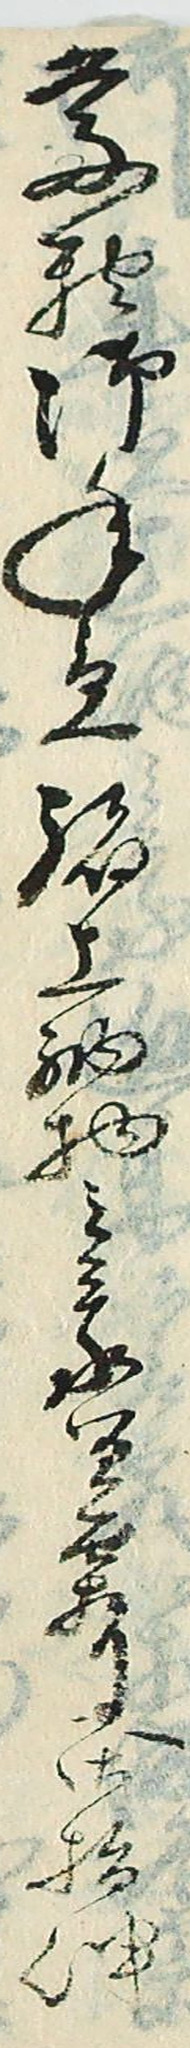当秋御年貢諸上納物之義閏霜月へ御指伸
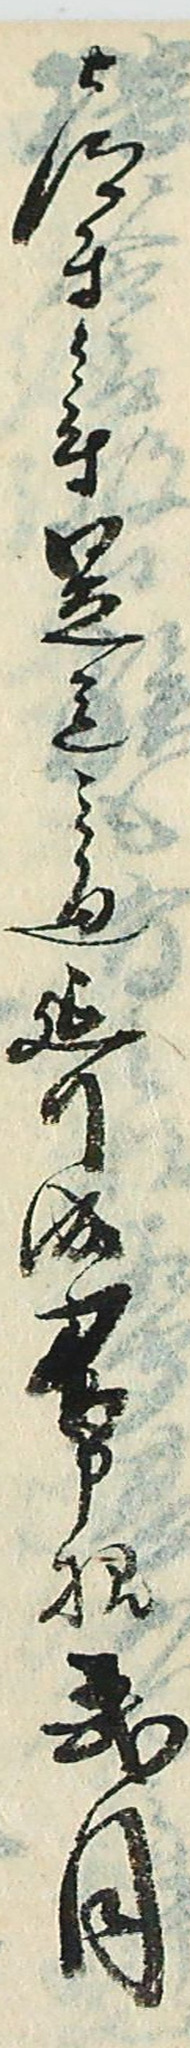被仰付候に付是迄之通延引成不申当月
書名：諸御用御□受書控
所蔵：鳴門教育大学 Naruto University of Education
